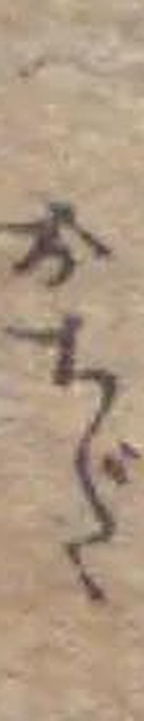おちだ
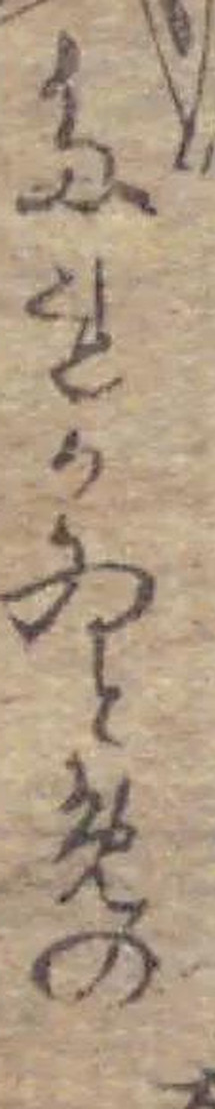たれかゐとめの
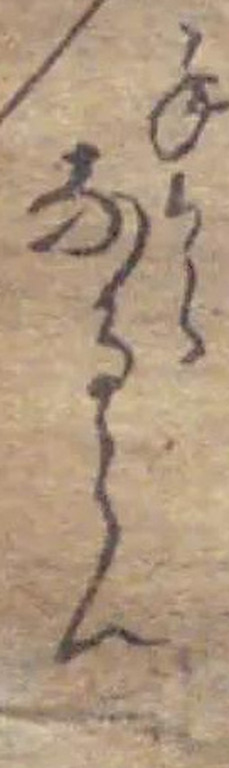なるらん

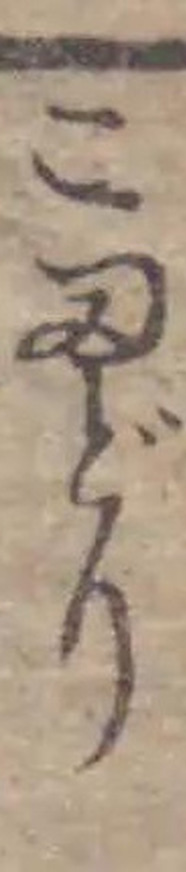こまどり
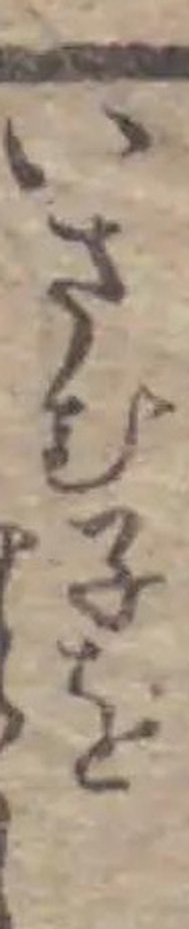いさむ子を
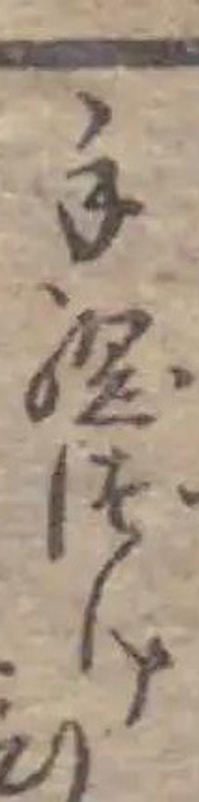手綱つけ
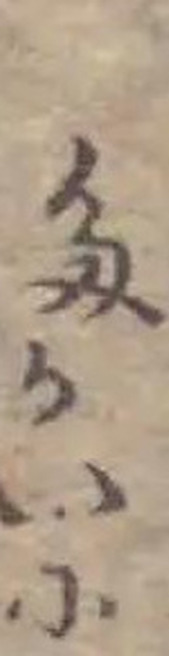たかいに
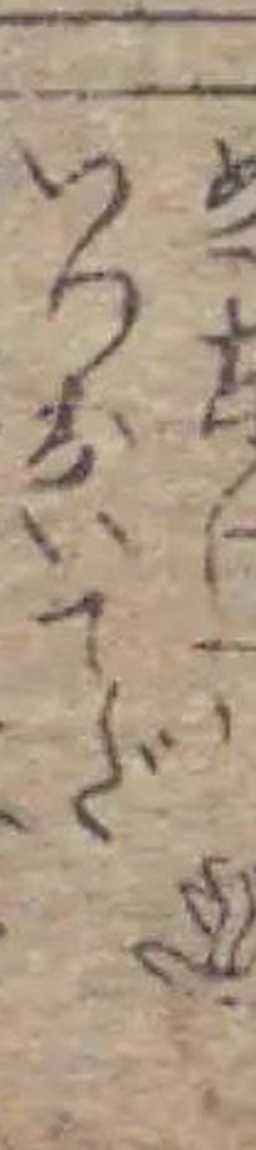いつおいでだ
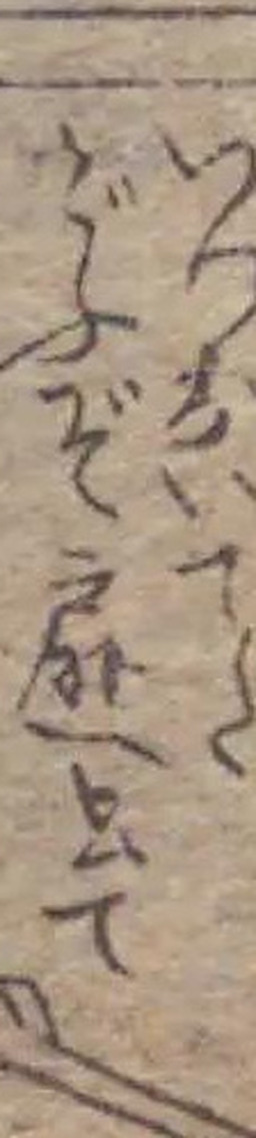どふぞ扇へ書て
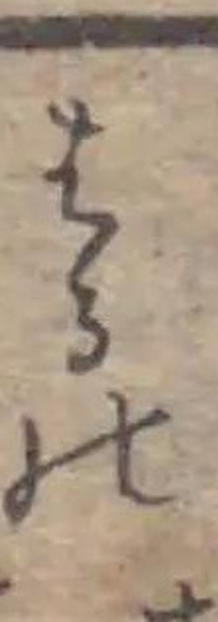はるの
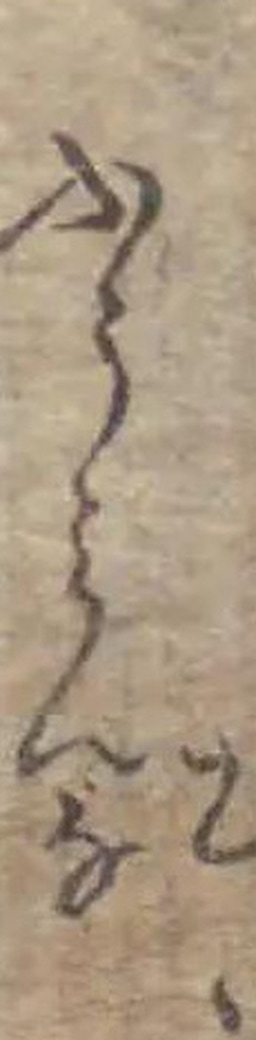ふうみんな
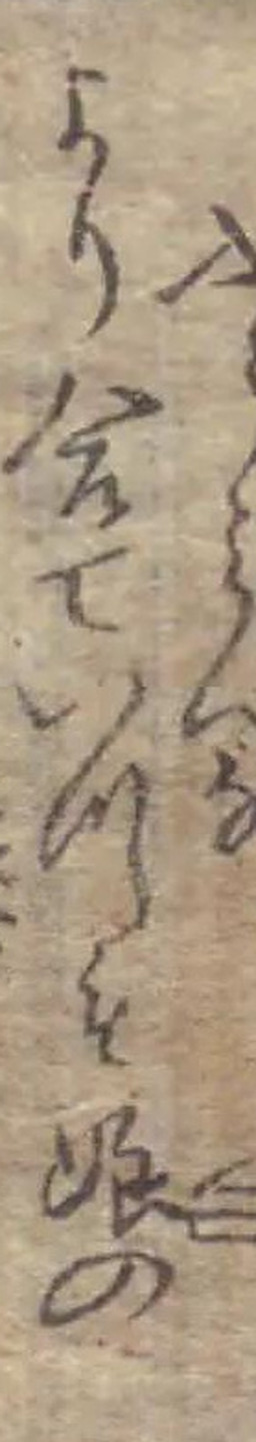より合ていつも娘の
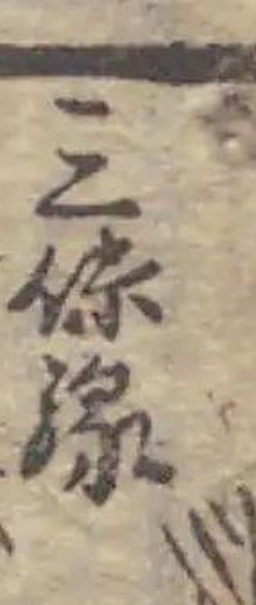三味線
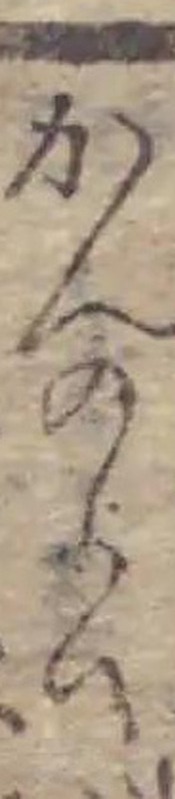かんのよい
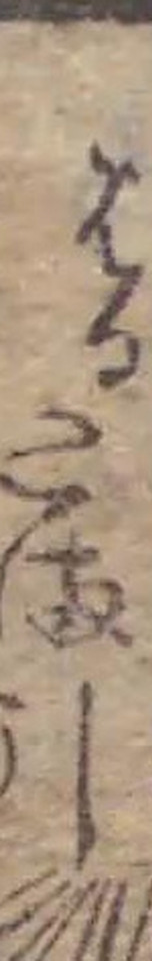はるこま引
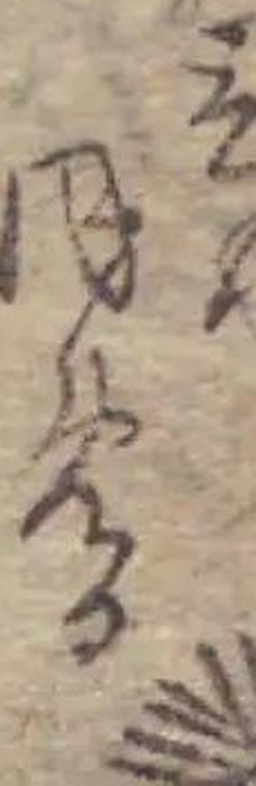ほめる
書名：金平子供遊 2巻
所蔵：国立国会図書館 National Diet Library, JAPAN
